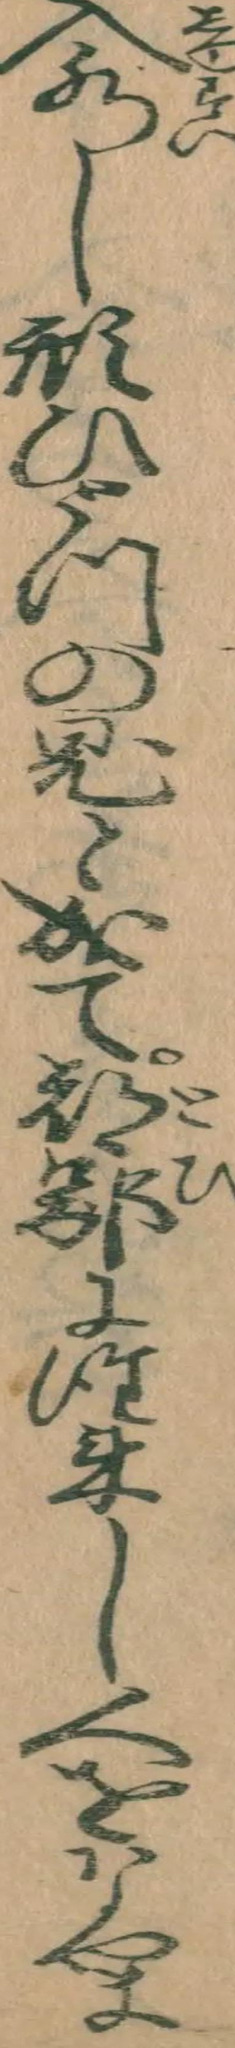入水し形ひとつの鬼と成て。都鄙に往来し人をなやま
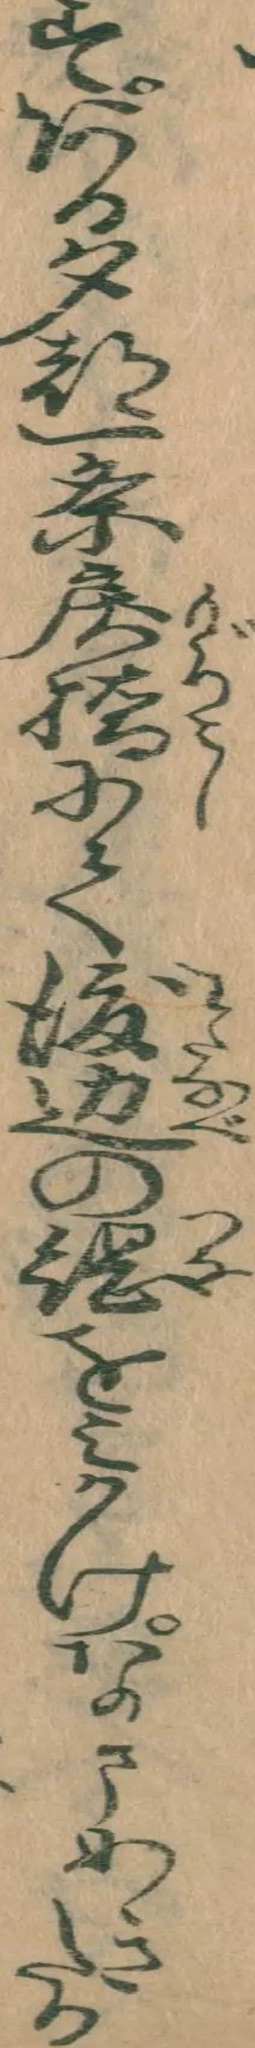す。ある夕都一条戾橋にて渡辺の綱をみかけ。なまめきたる
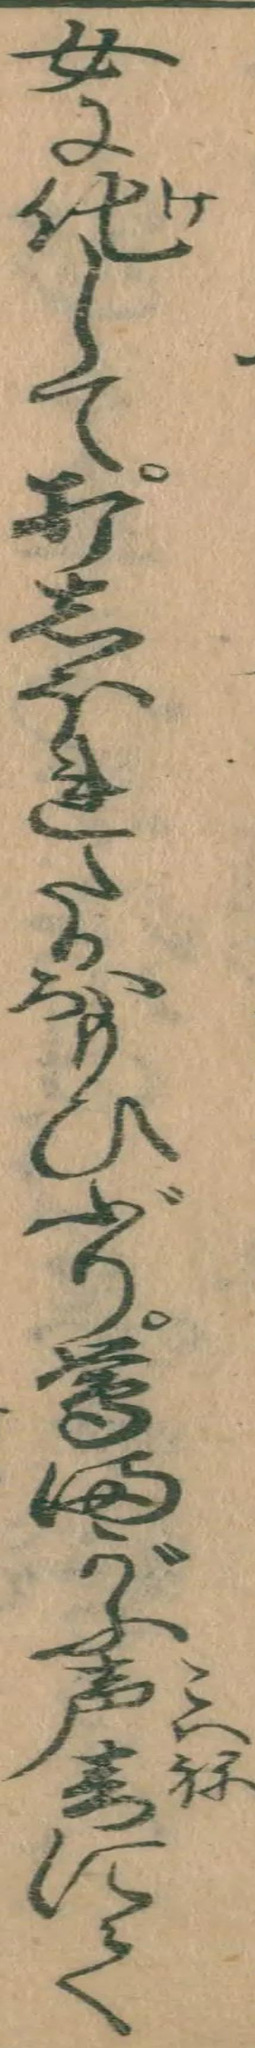女に化して。打しほれたりおもひぶり。鴬まがふ声音にて
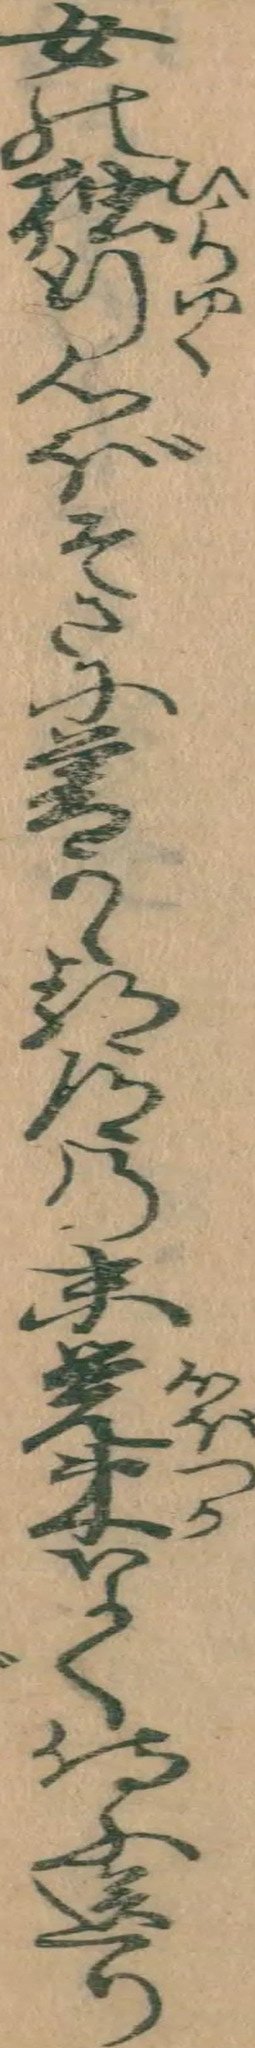女の独行心ぼそさに暮かゝる道の末覚束なく侍ふ送り
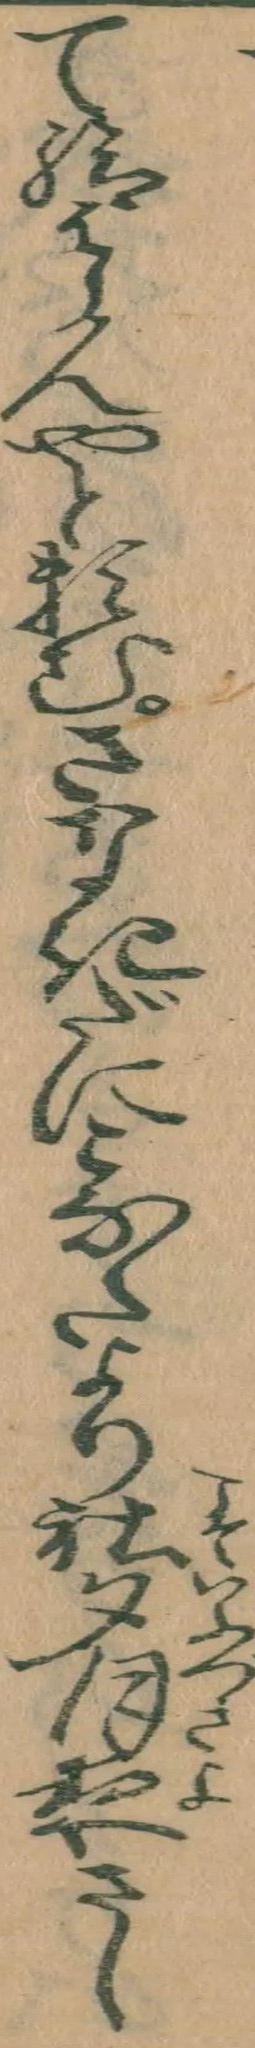て給はらんやと頼む。さなきだにこなたより社夕月夜さし
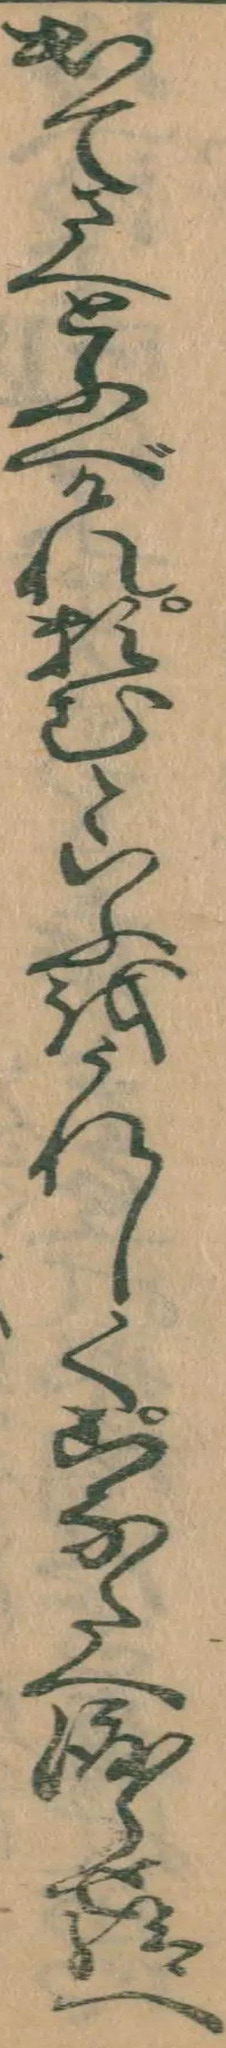出てさへとふべけれ。頼むといふをうれしく。こなたへ渡らせ給へ
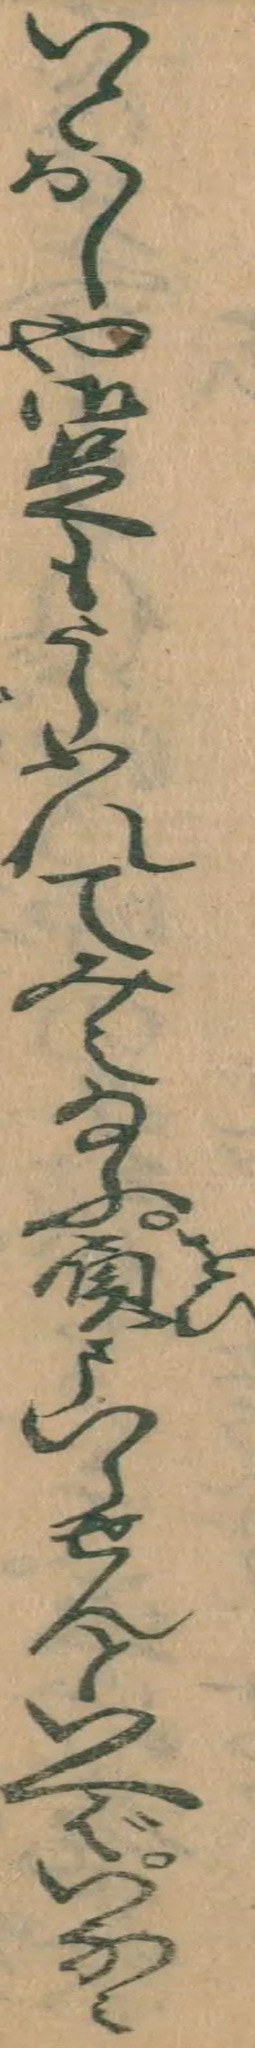いとおしや御足もうらふれてみえ給ふ。負まいらせんといへば。いなみ
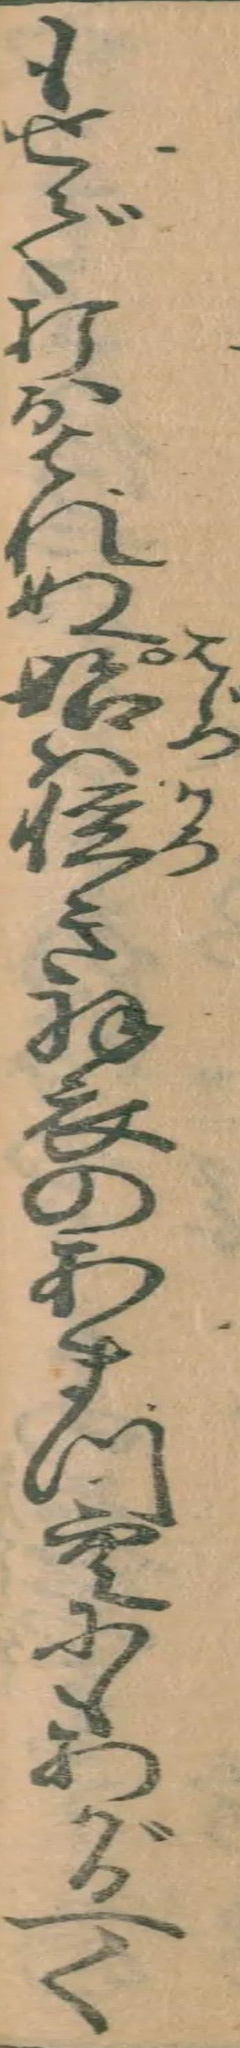もせで打おはれぬ。始は軽き羽衣のあまつ空にもあがるへ〱
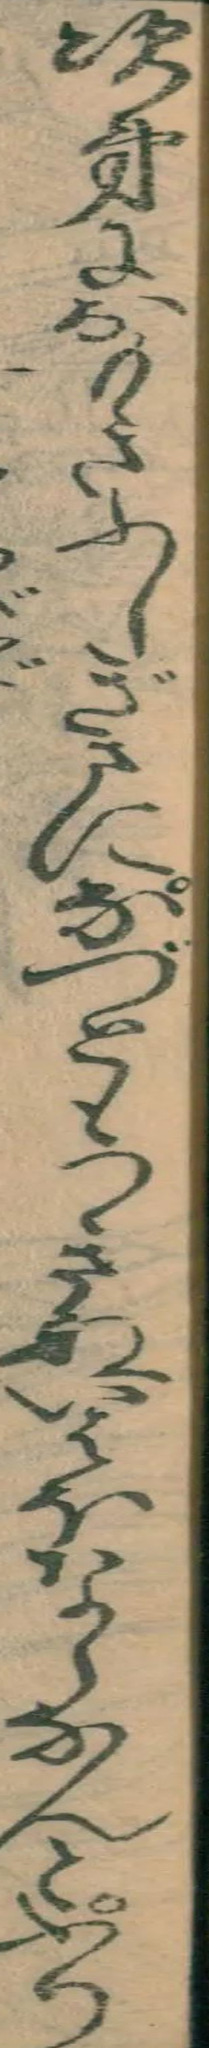次第におもきふしぎさに。。なづともつきぬいはほならなんと。ふり
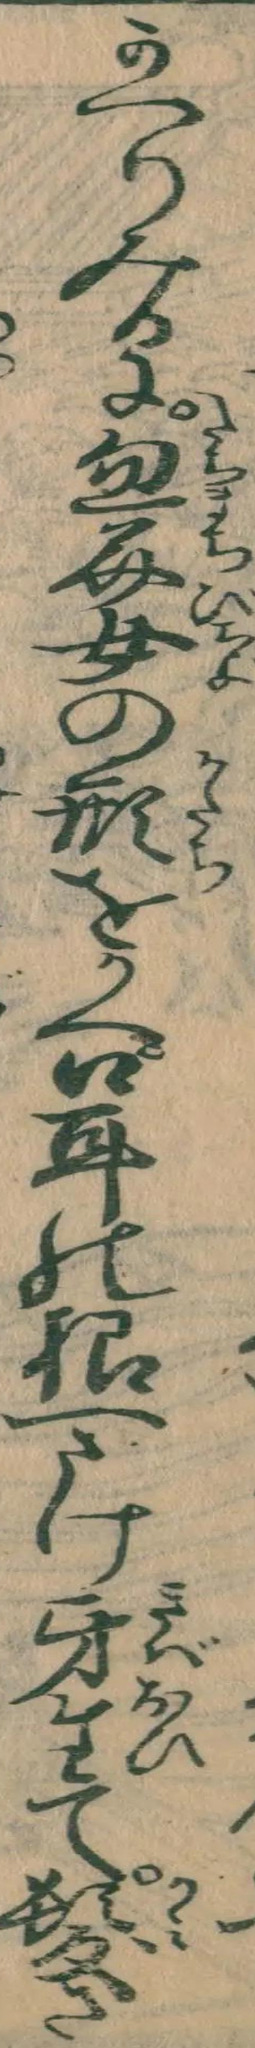かへりみるに。忽美女の形をかへ。口耳の根へさけ牙生て。髪さ
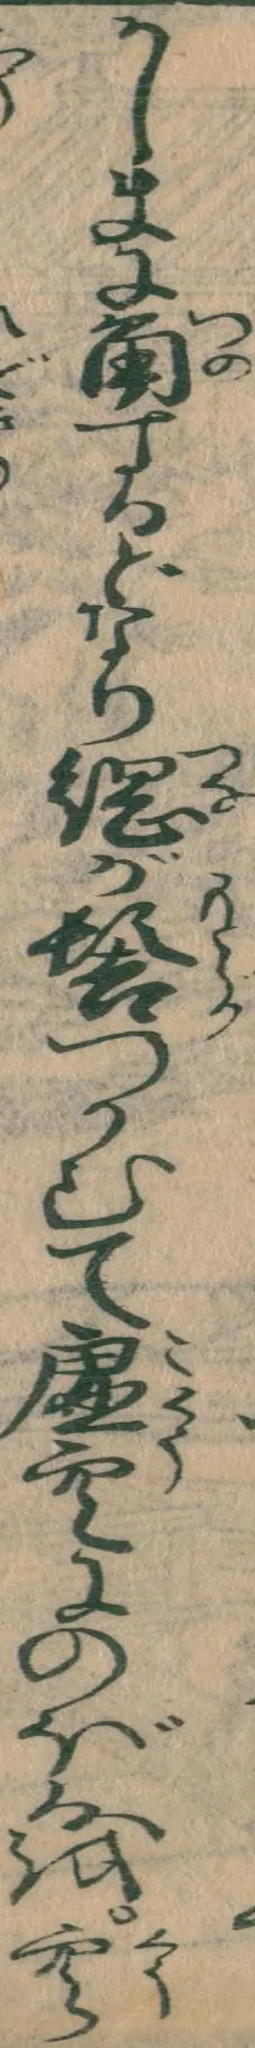かしまに角するどなり綱が髻つかむて虚空のぼるを。空
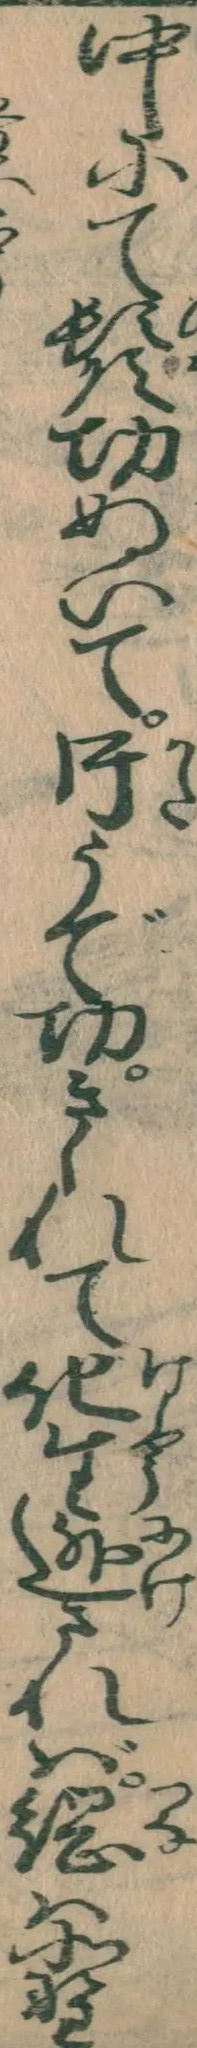中にて鬚切ぬいて。片うで切。きられて化生逃されば。綱は北野
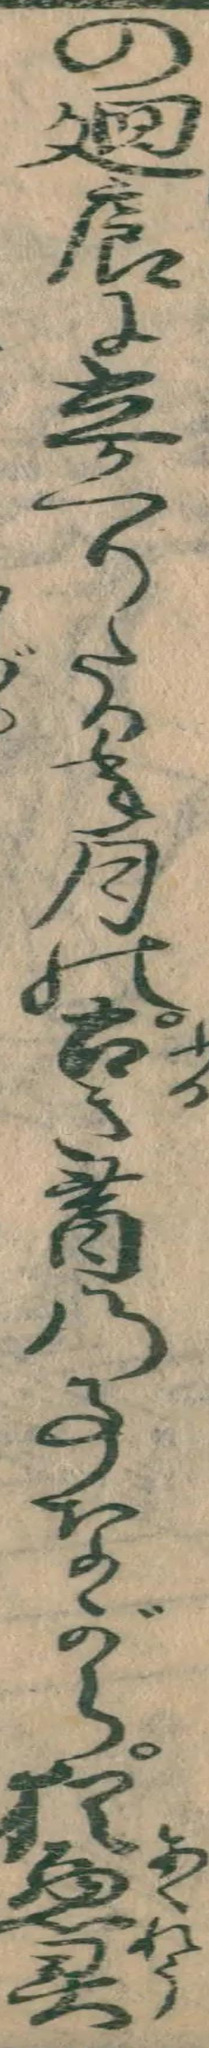の廻廊に立かへりたる年月の。古き昔の事ながら。猶悪霊
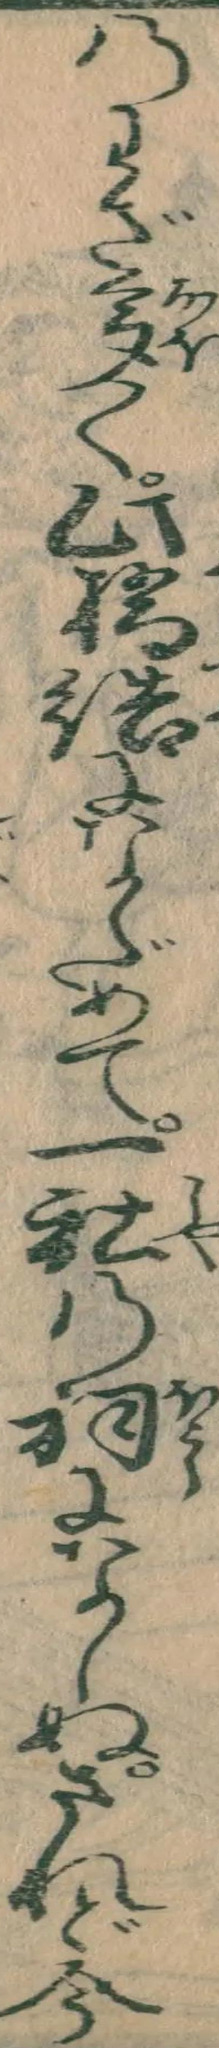のわざ多〱。此橋結になだめて。一社の祠になしぬ。されど今
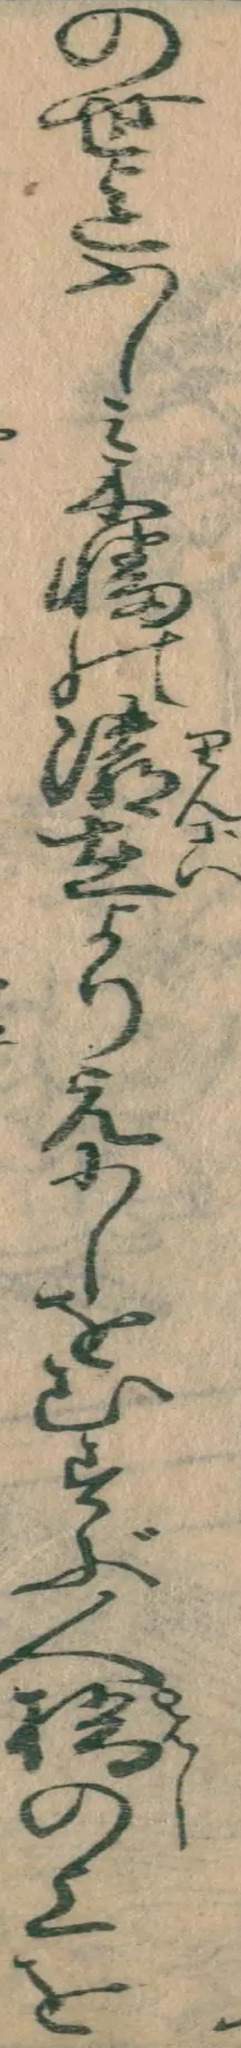の世迄ふしみ木幡の隣在よりえにしをむすぶ人。橋の上を
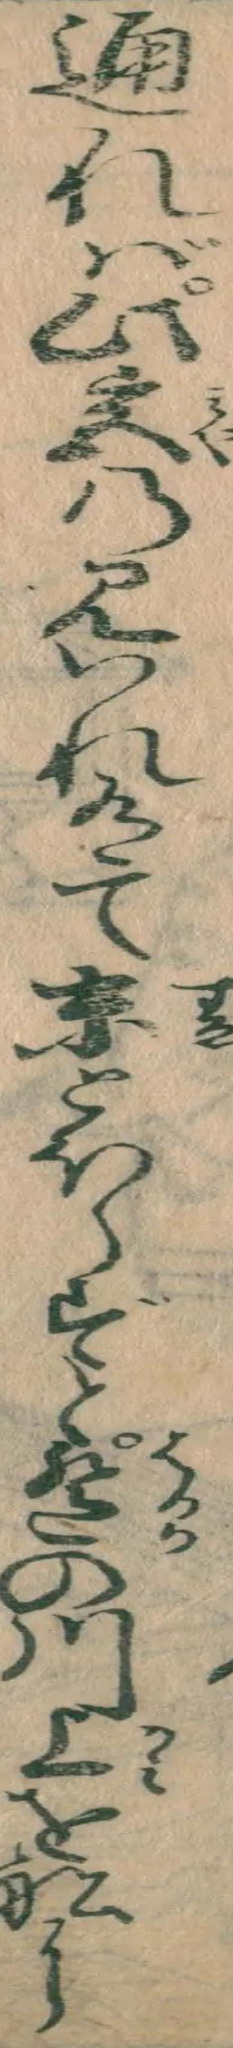通れば。此宮の見いれ有て末とほらずと。遥の川上を船に
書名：新竹斎 5巻
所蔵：国立国会図書館 National Diet Library, JAPAN
